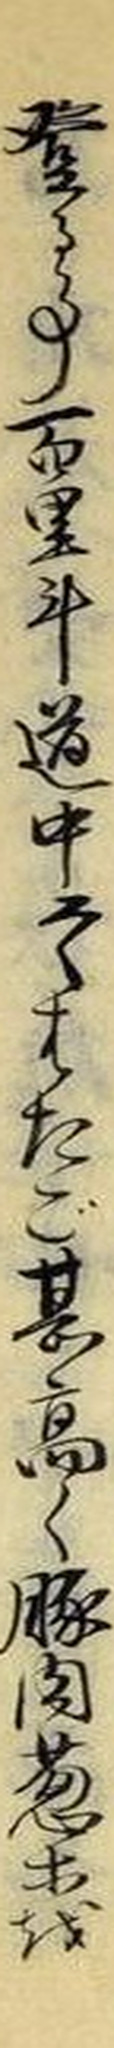登る事百里計道中之はたご甚高く豚肉葱等を
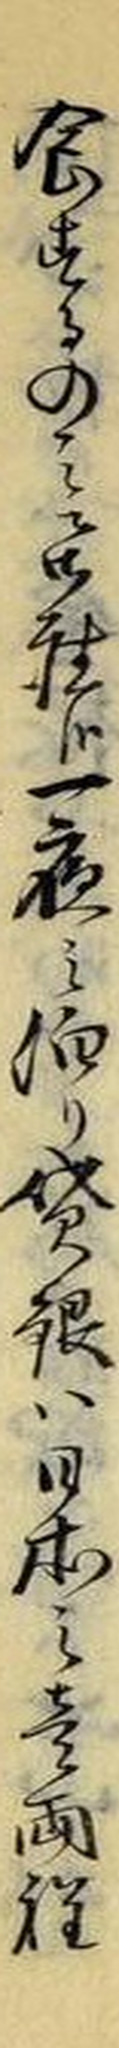食するのミニ御座候一夜之泊り賃銀ハ日本之壱両程
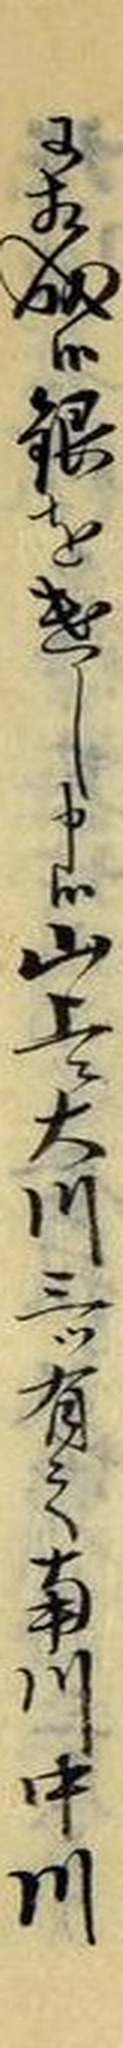に相成候銀を遣し申候山上二大川三ッ有之南川中川

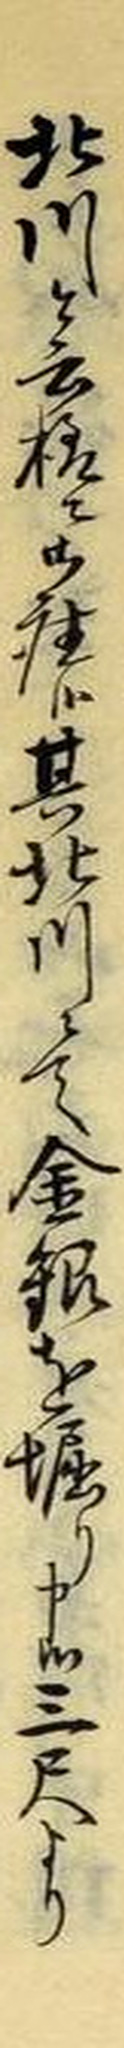北川と云様ニ御座候其北川ニて金銀を掘り申候三尺より
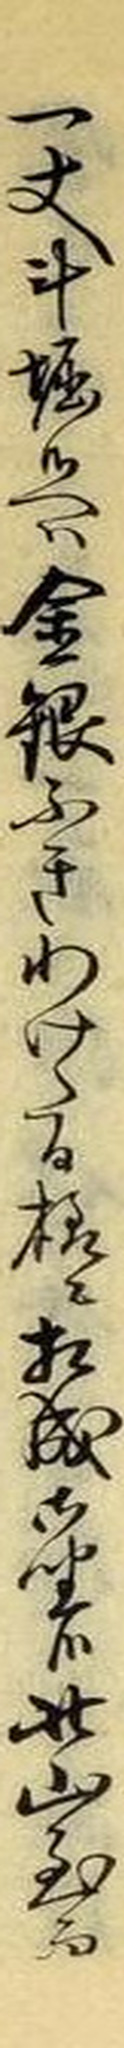一丈計堀候へハ金銀ふきわけたる様ニ相成御座候此山至而
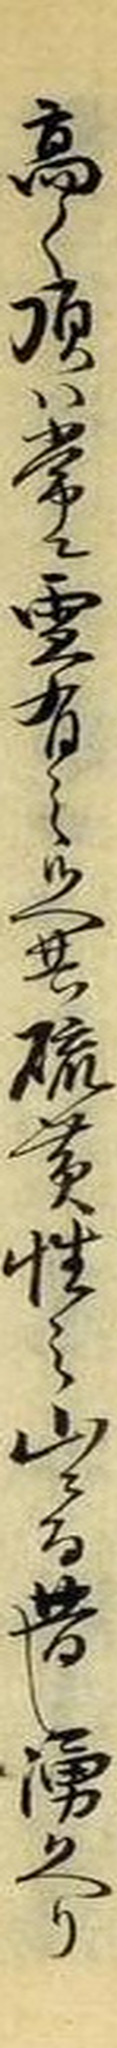高く頂ハ常ニ雲有之候へ共硫黄性之山ニ而昔し湧かへり
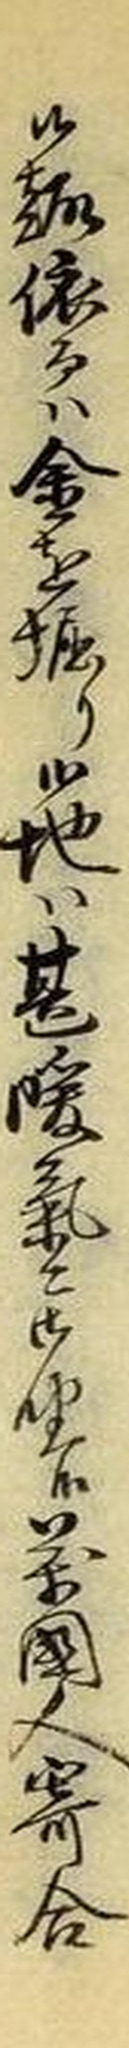候趣依而ハ金を掘り候地ハ甚暖気ニ御座候万国人寄合
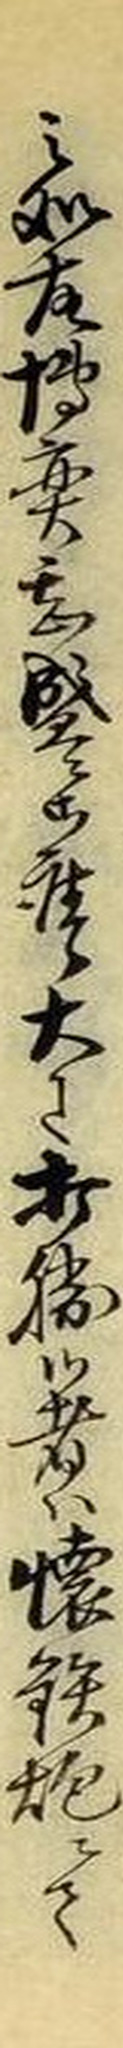之処故博奕甚盛ニ御座候大に打勝候者ハ懐鉄砲二て
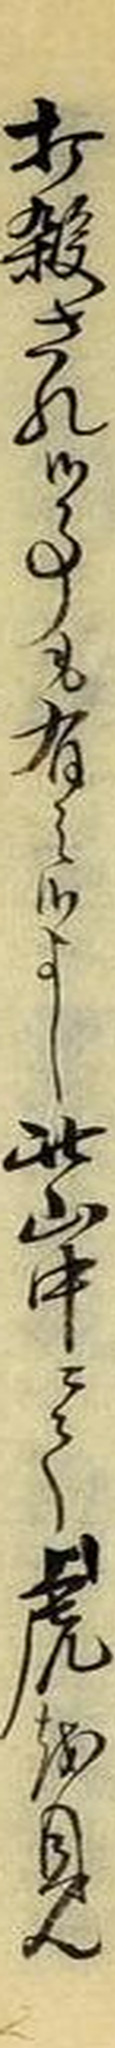打殺され候事も有之候よし此山中二て虎を見
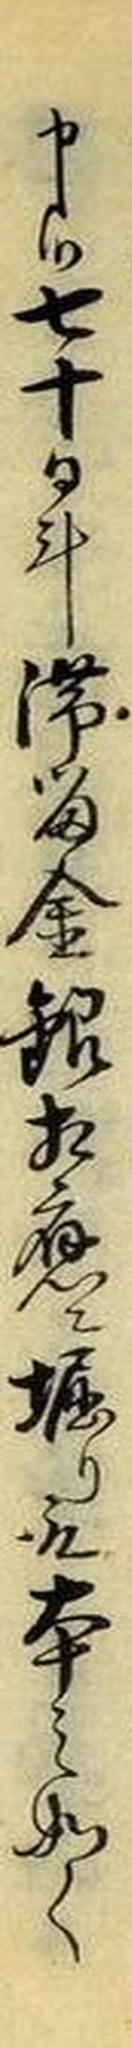申候七十日計滞留金銀相応二掘り取本之如く
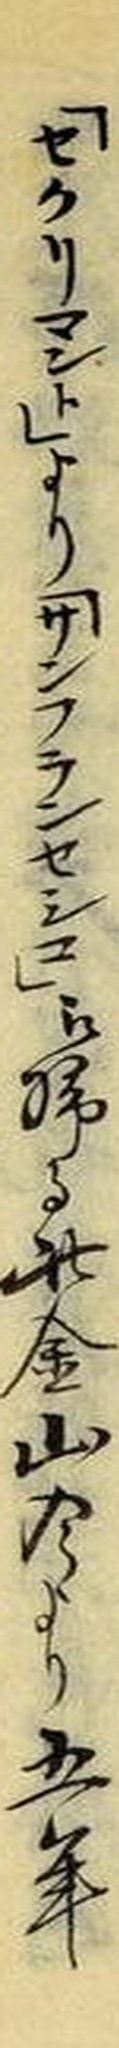「セクリマント」より「サンフランセシコ」江帰る此金山今より五年
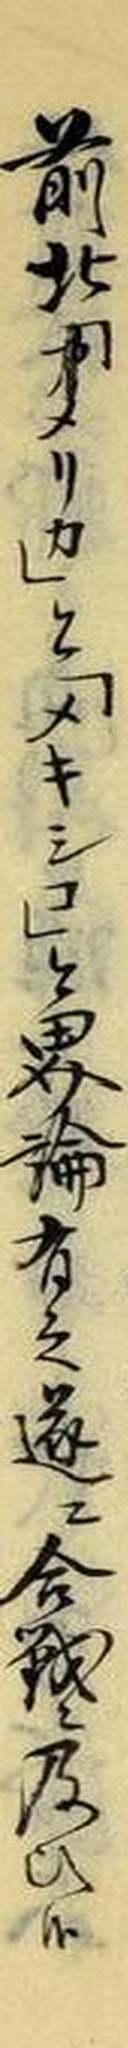前北「アメリカ」と「メキシコ」と界論有之遂二合戦二及ひ候
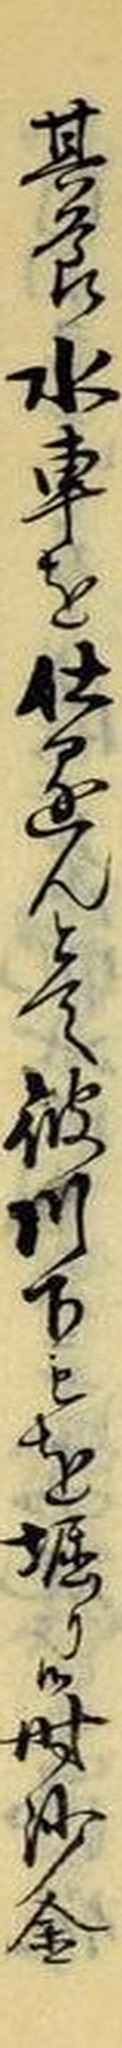其節水車を仕遂んとて彼川下もを掘り候時砂金
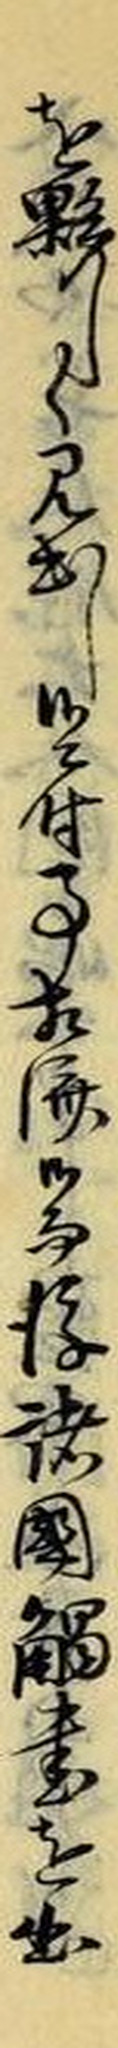を夥しく見出し候二付事相済候而後諸国触書を出
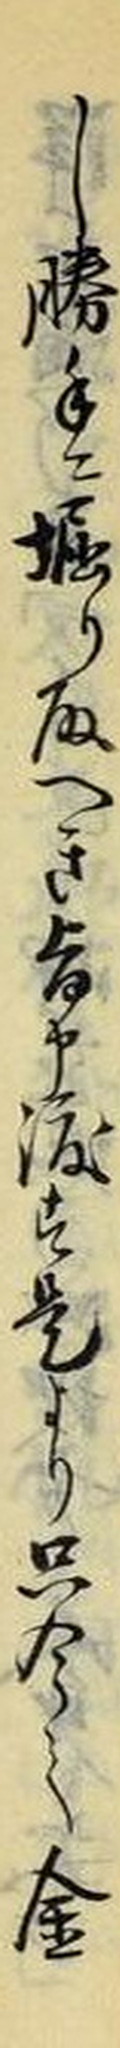し勝手ニ掘り取へき旨申渡す是より只今之金
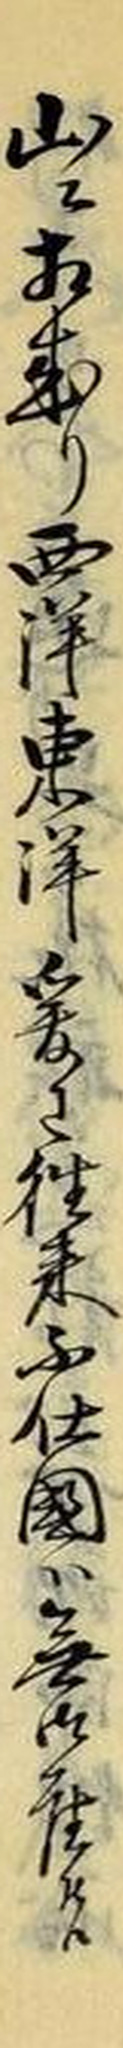山ニ相成り西洋東洋爰に往来不仕国ハ無御座候ハ
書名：漂客談奇（備考雑録写8）
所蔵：福井県文書館 Fukui Prefectural Archives
